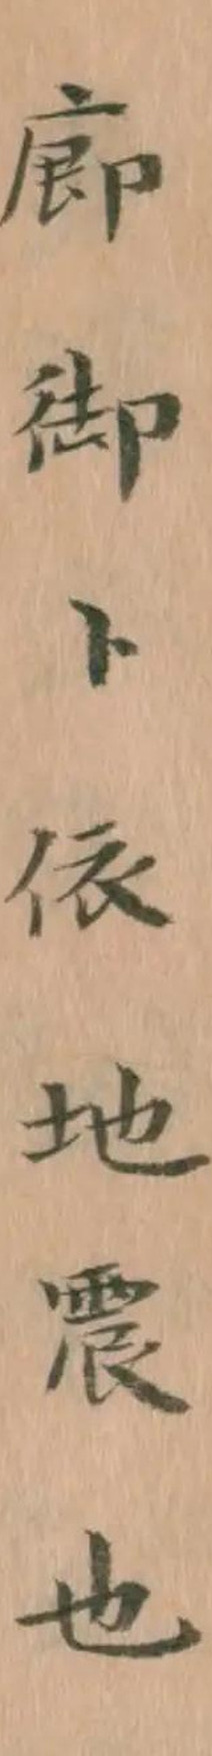廊御卜依地震也
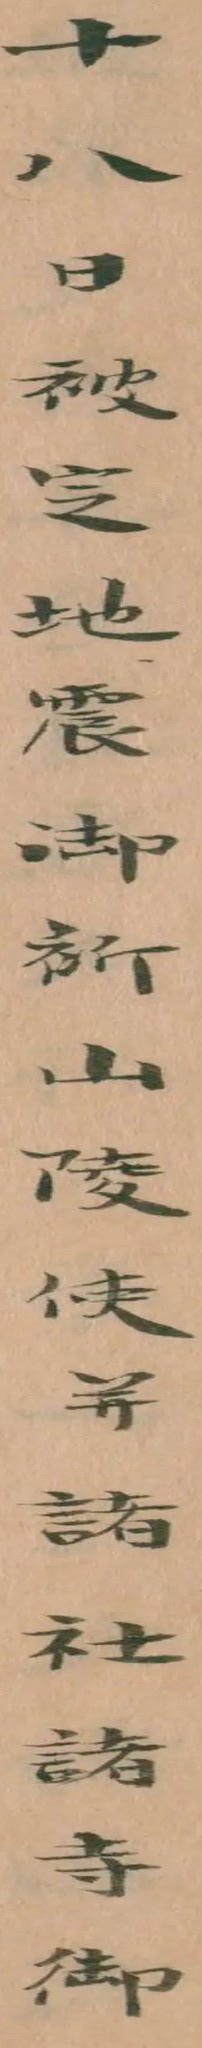十八日被定地震御祈山陵使幷諸社諸寺御
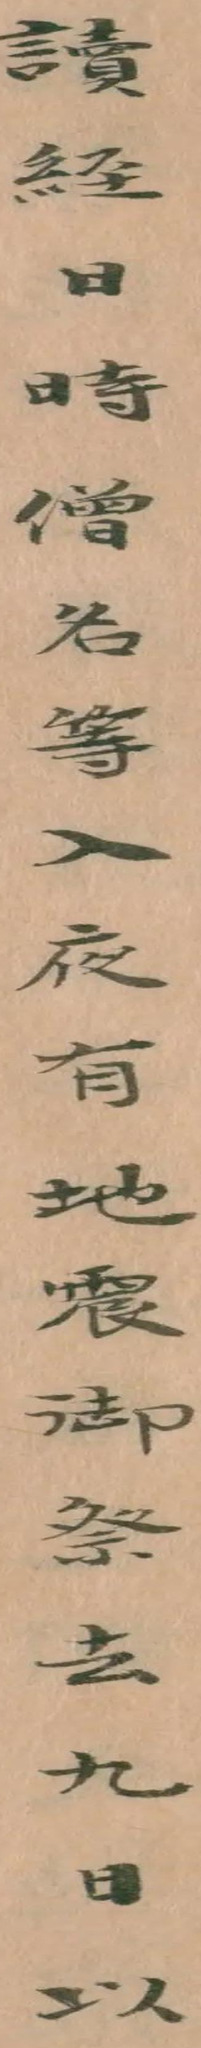読経日時僧名等入夜有地震御祭去九日以
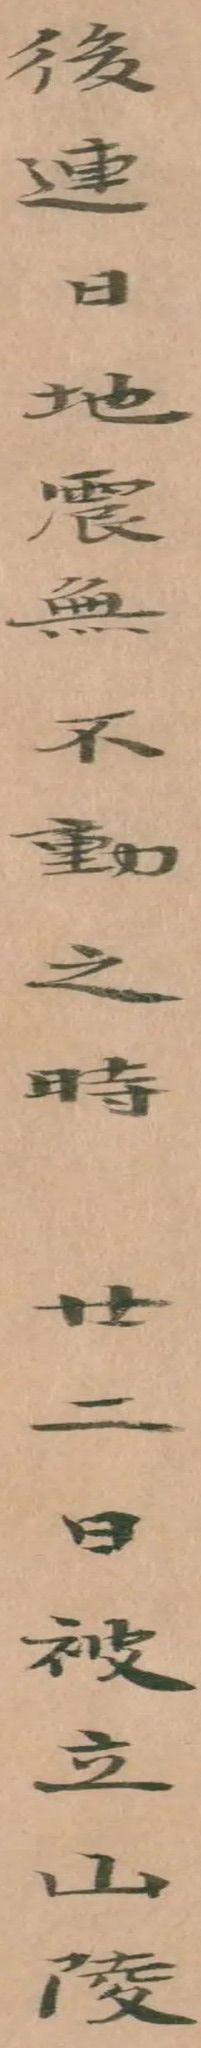後連日地震無不動之時廿二日被立山陵
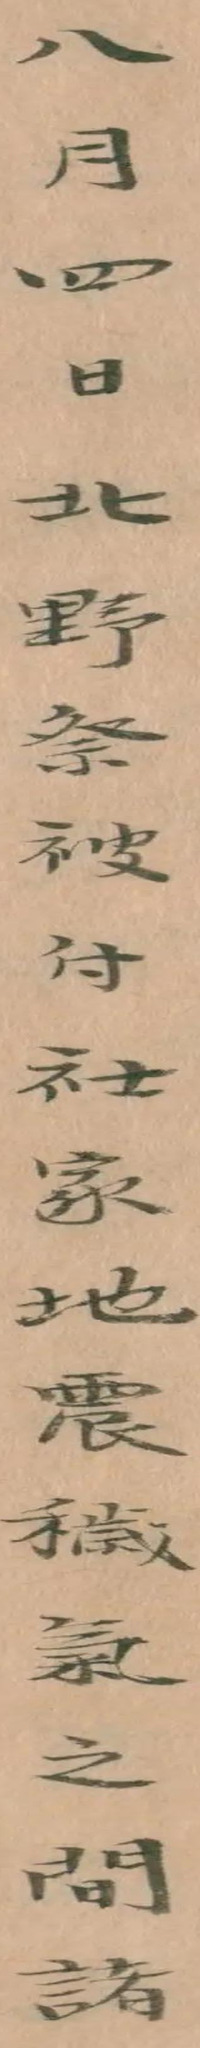八月四日北野祭被付社家地震穢気之間諸
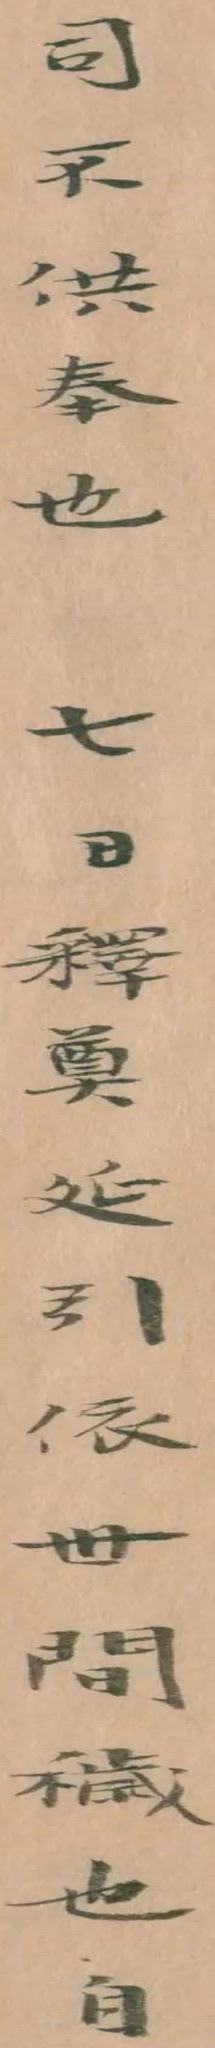司不供奉也七日釈尊延引依世間穢也自

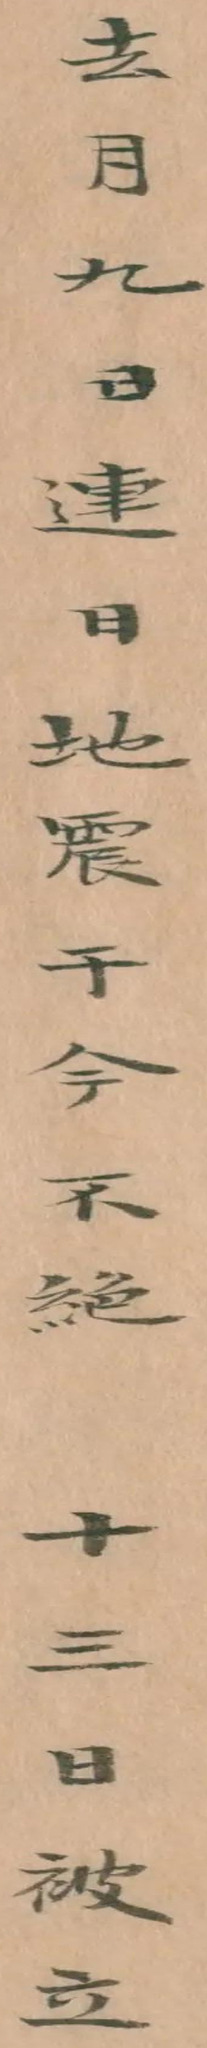去月九日連日地震于今不絶十三日被立
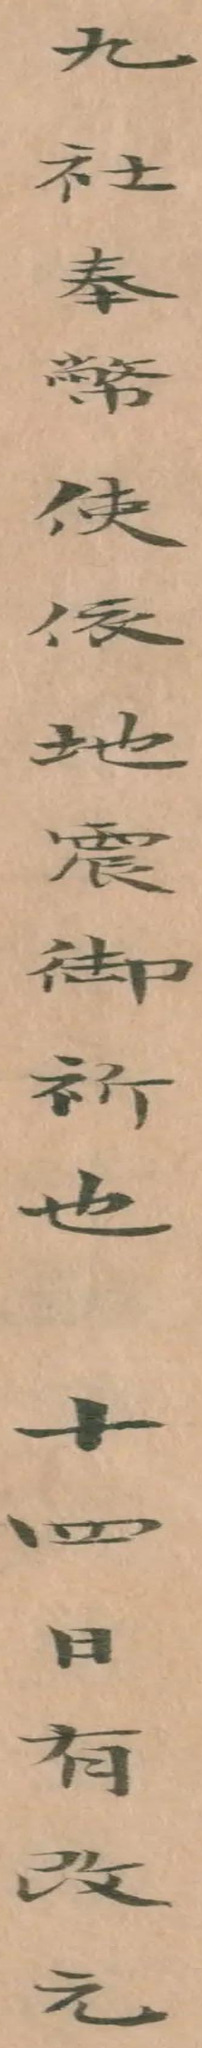九社奉幣使依地震御祈也十四日有改元
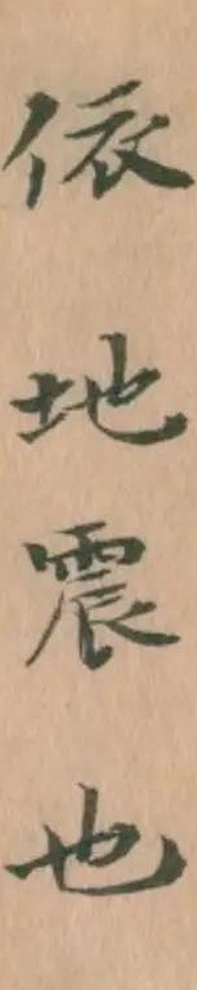依地震也
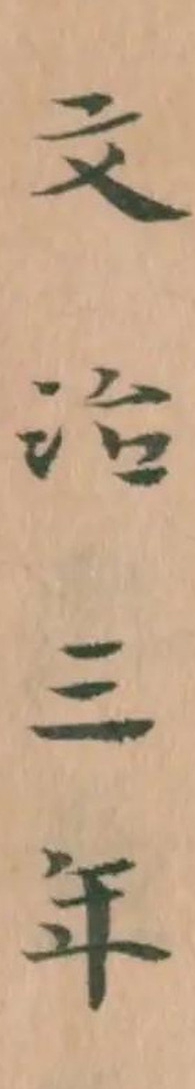文治三年
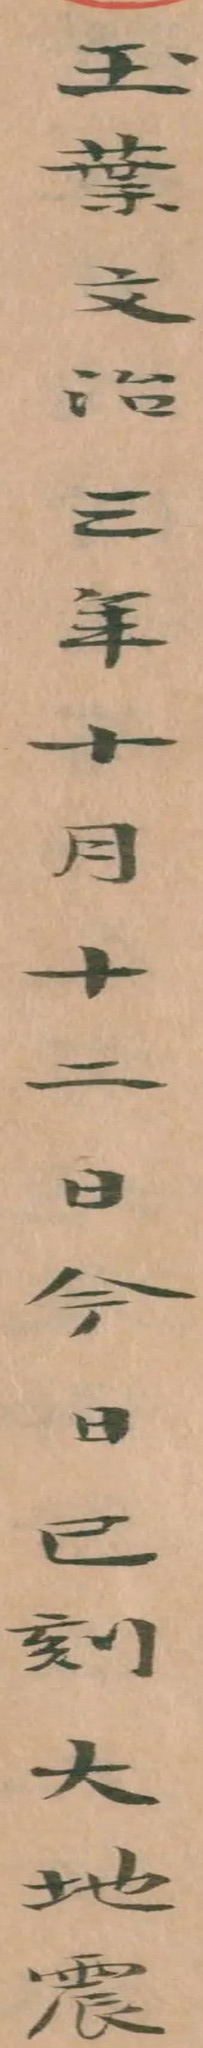○玉葉文治三年十月十二日今日巳刻大地震
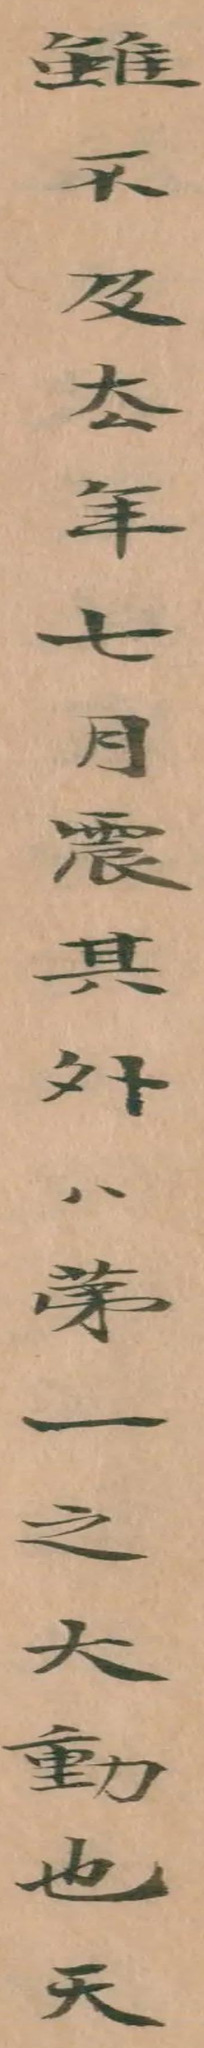雖不及去年七月震其外ハ第一之大動也天
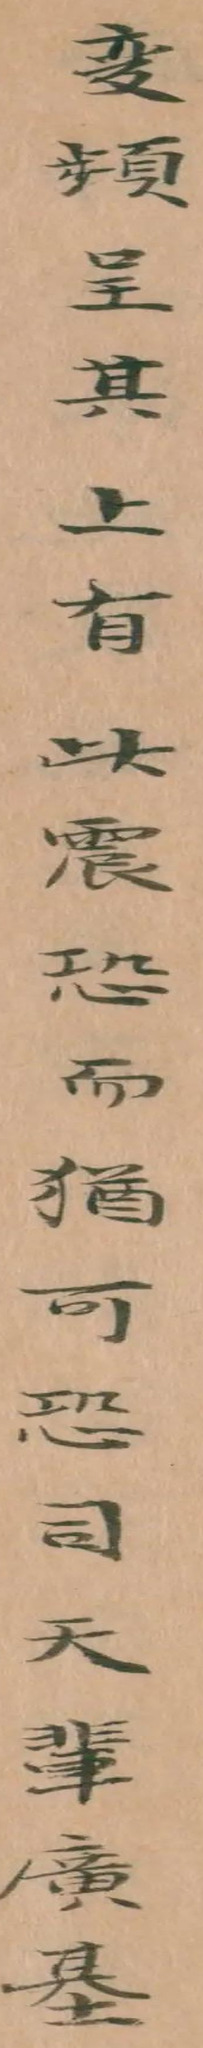変頻呈其上有此震恐而猶可恐司天輩広基
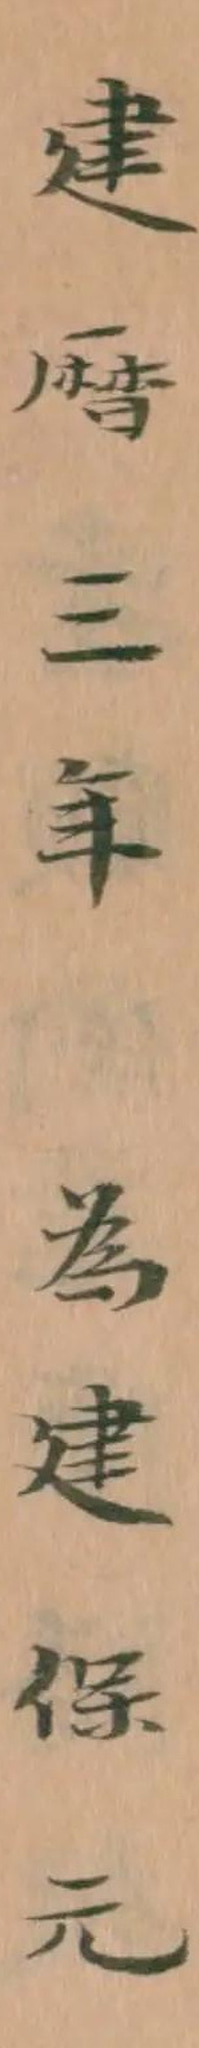建暦三年為建保元
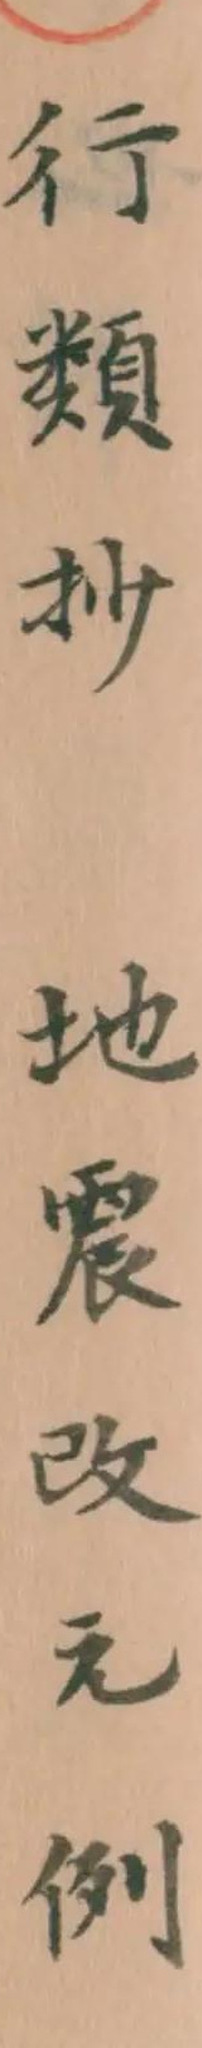○行類抄地震改元例
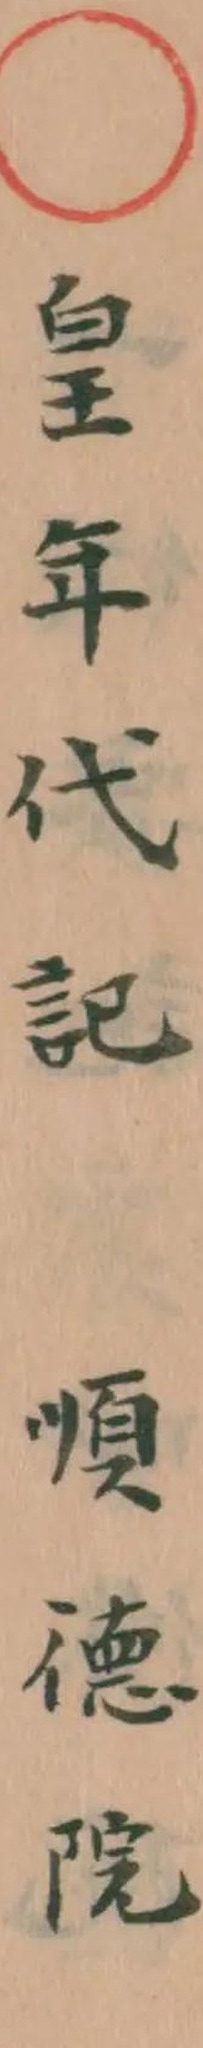○皇年代記順徳院
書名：地災撮要. 巻5-6(地震之部)
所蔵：国立国会図書館 National Diet Library, JAPAN
